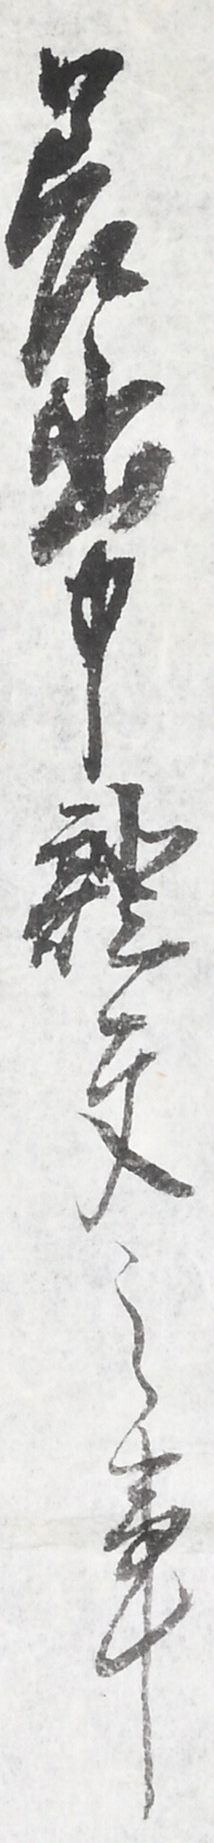差出申証文之事
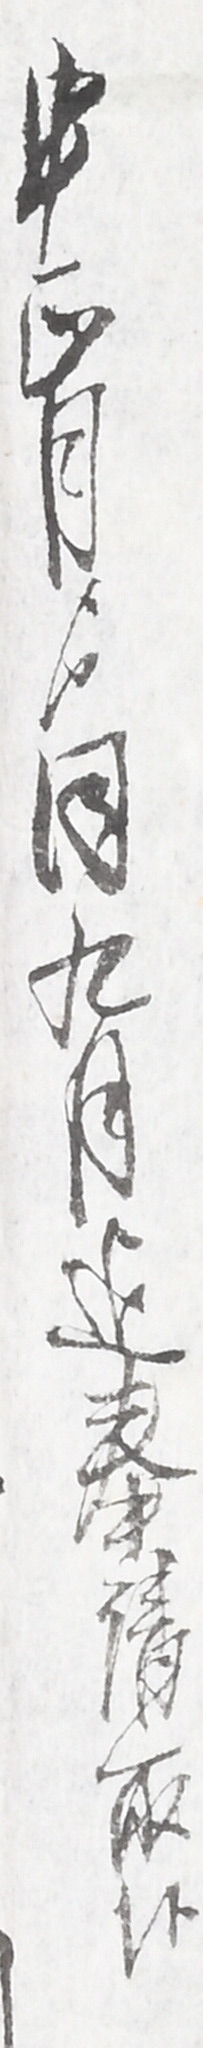申正月ゟ同九月迄奉請取候
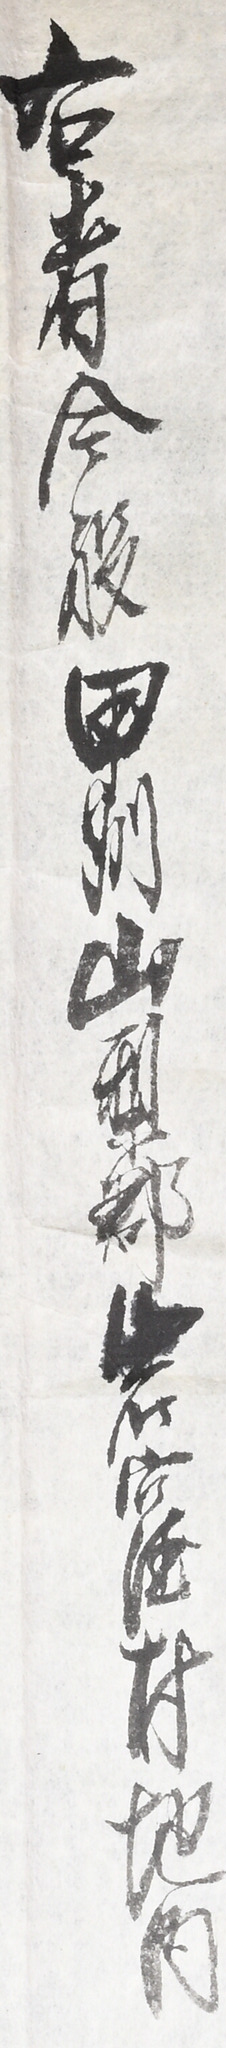右者今般甲州山梨郡岩窪村地内
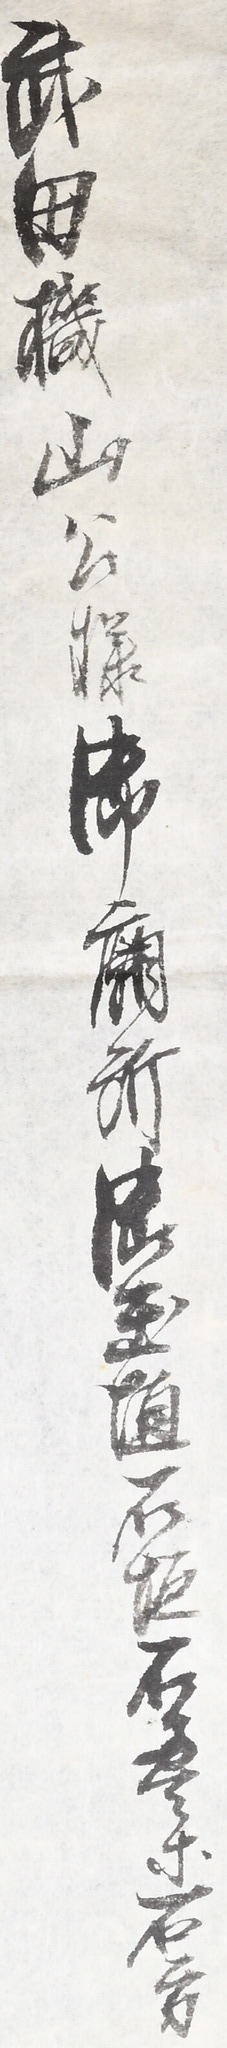武田機山公様御廟所御玉垣石垣石畳等石方
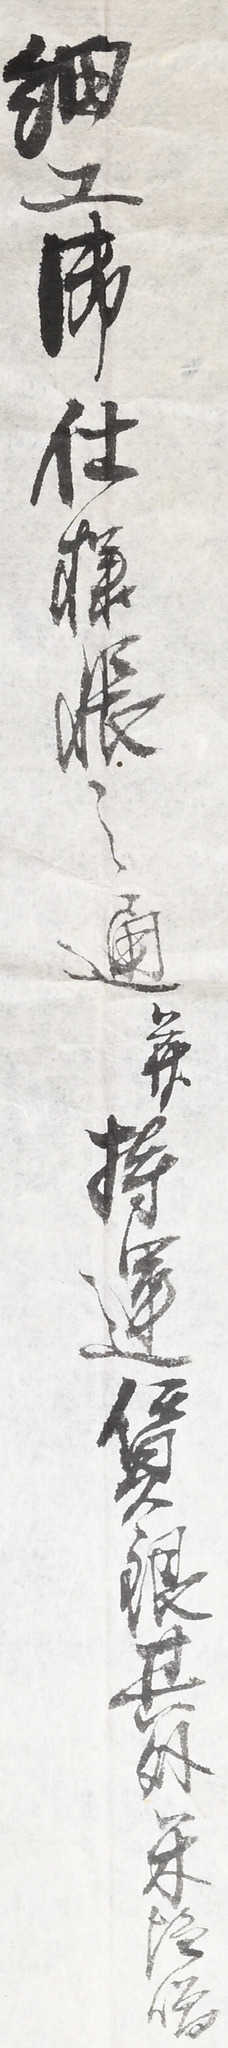細工御仕様帳之通并持運賃銀其外米塩噌
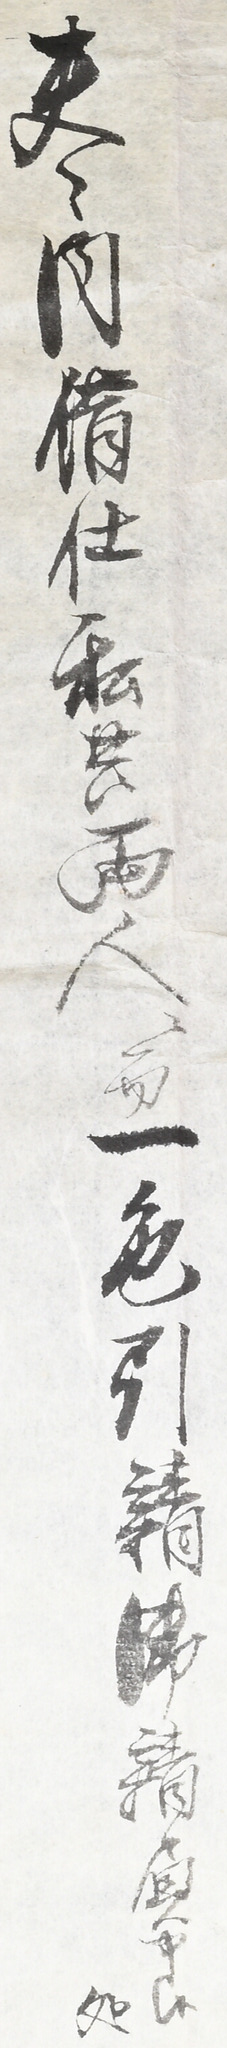夫々内借仕私共両人ニ而一色引請御請負申候処
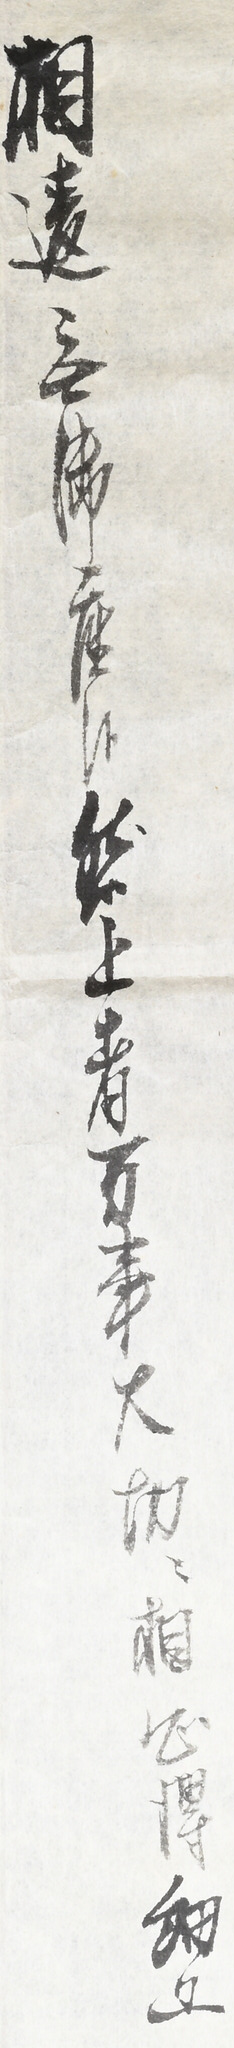相違無御座候然上者万事大切ニ相心得細工
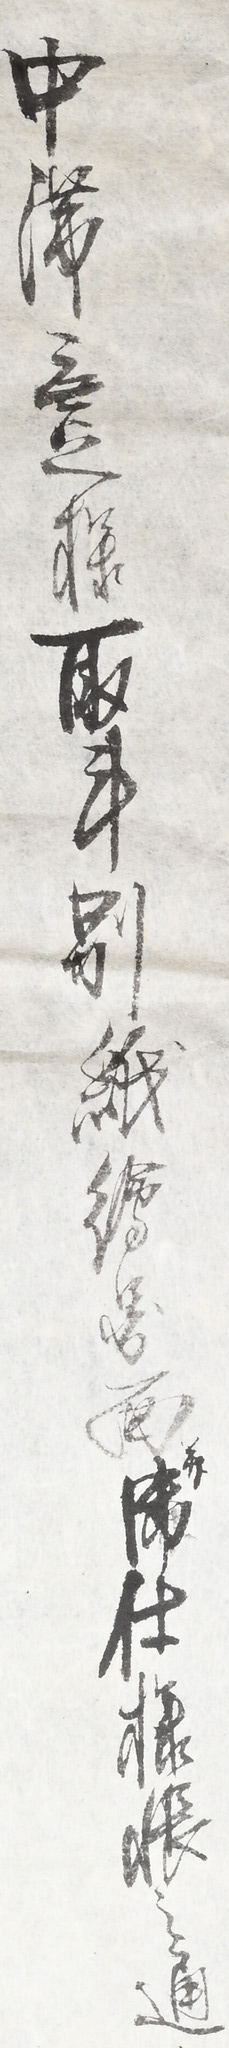中滞無之様取計別紙絵図面并御仕様帳之通
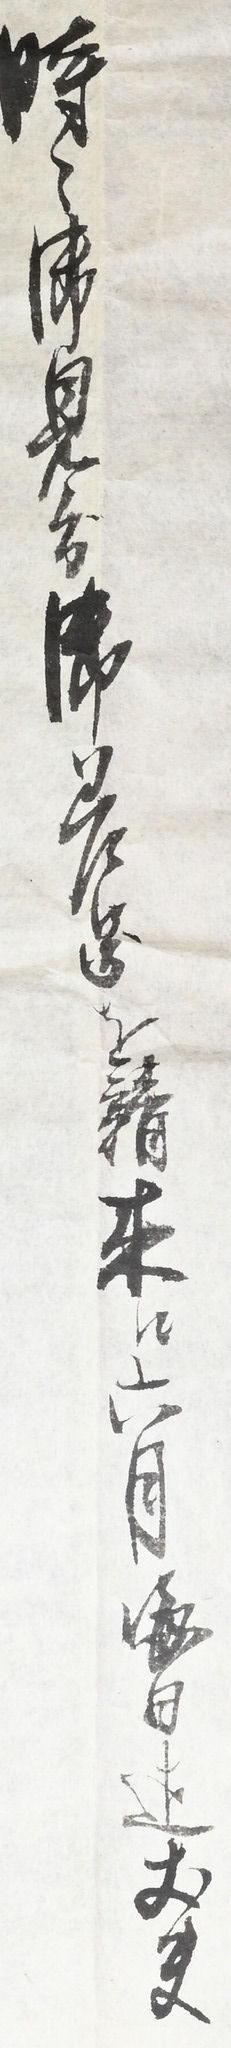時々御見分御差図を請来ル六月晦日迄丈夫
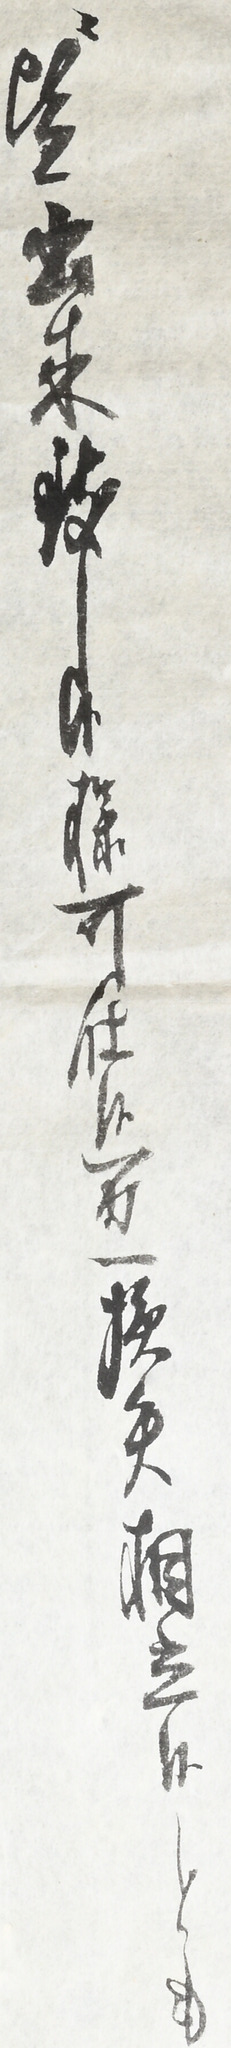ニ皆出来致し候様可仕候万一損失相立候とも
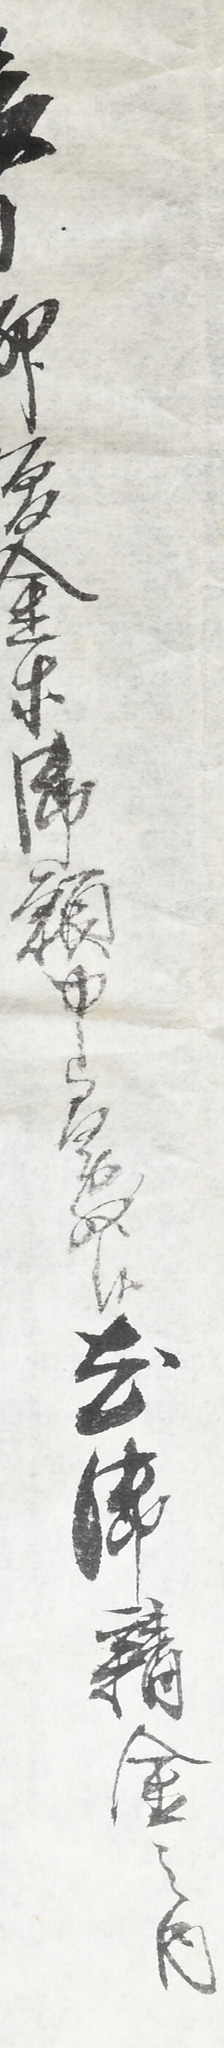後日聊増金等御願申間敷候尤御請金之内

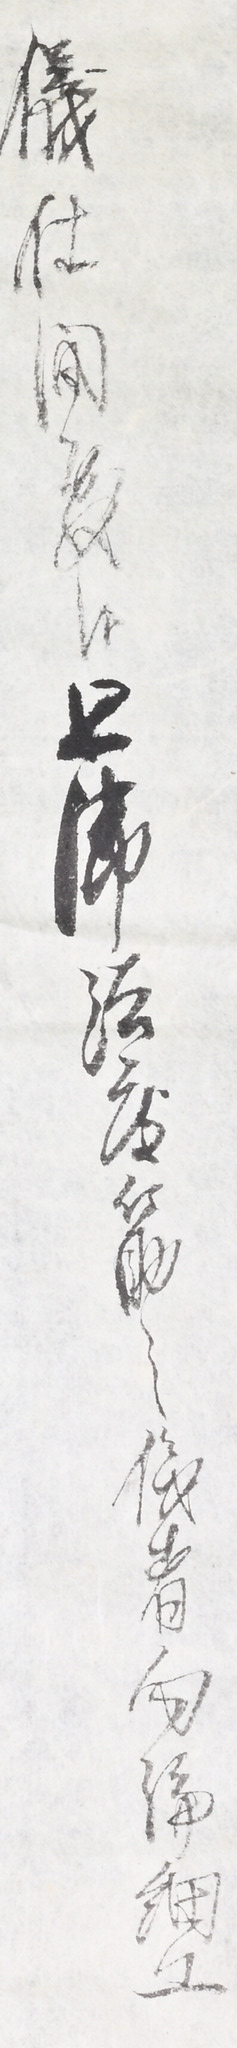儀仕間敷候且御法度筋之儀者勿論細工
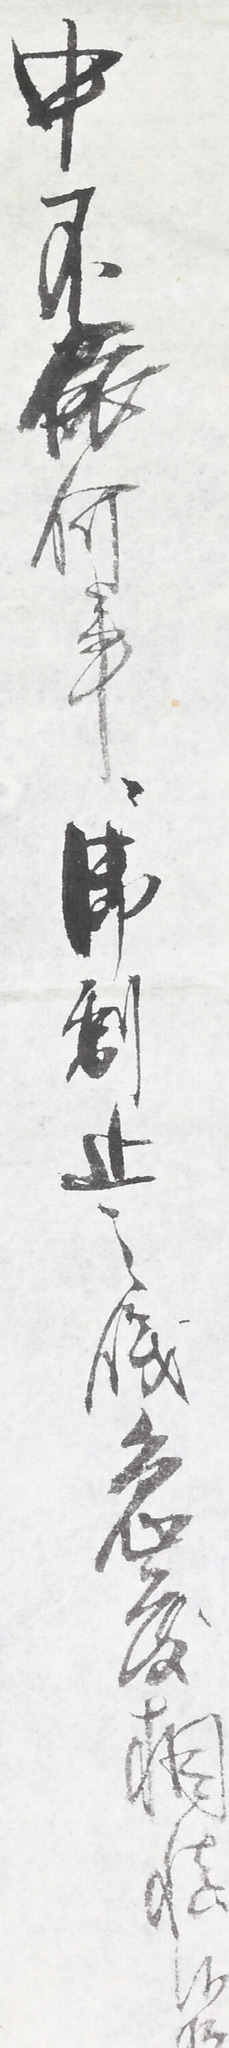中不依何事御制止之儀急度相慎候
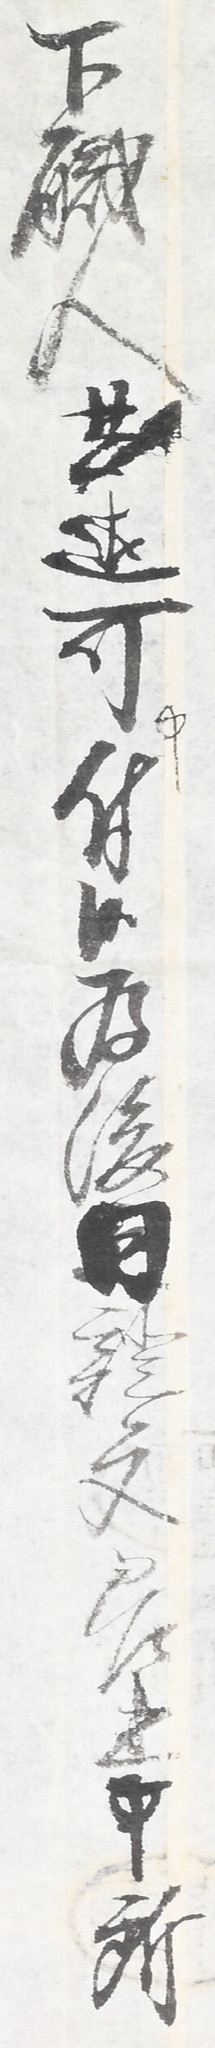下職人共迄可キ付候為後日証文差上申所
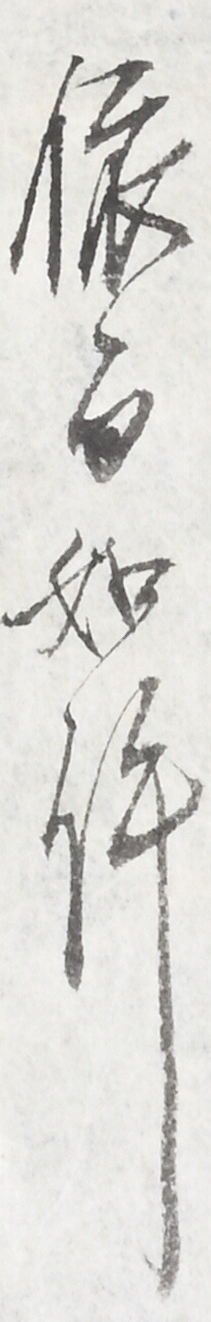依而如件
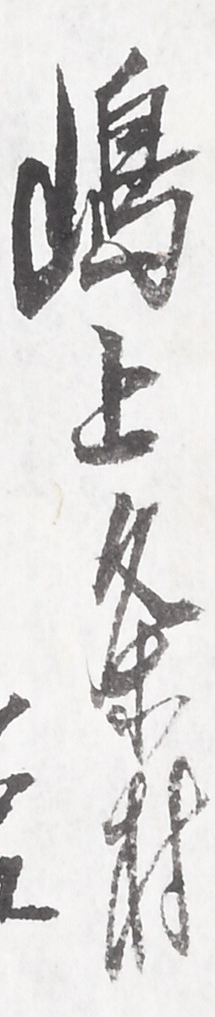嶋上条村
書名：差出申證文之事
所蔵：伊那市立高遠町図書館・合同会社AMANE
